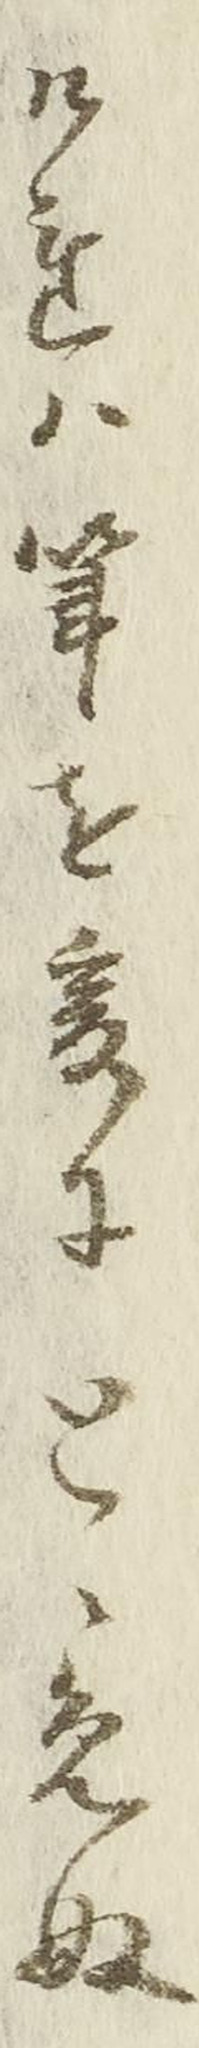けれハ筆を爰にとゝめぬ

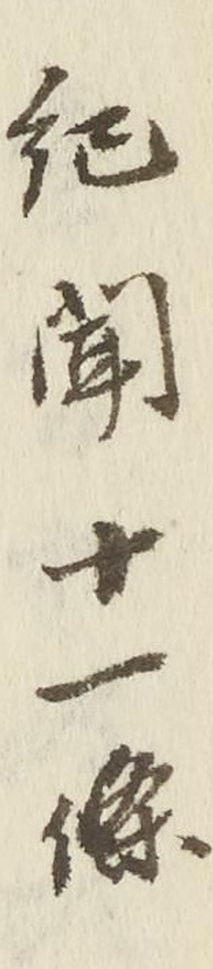紀聞十一條
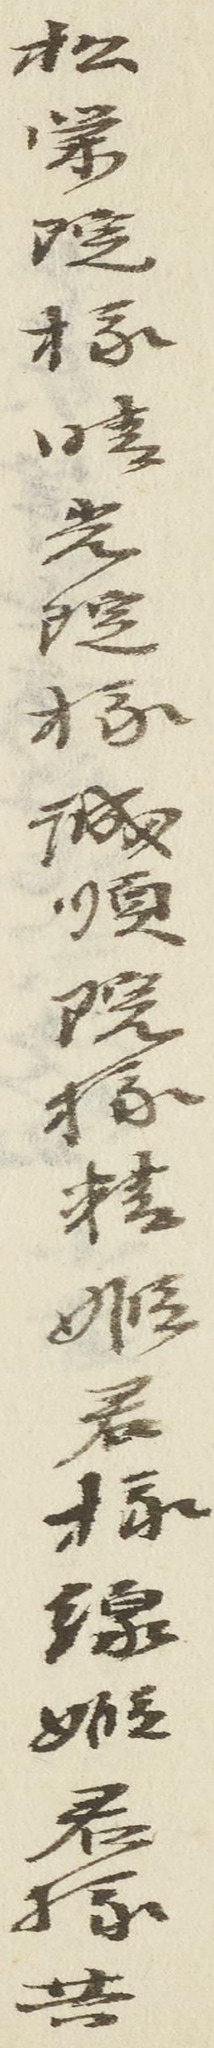松栄院様晴光院様誠順院様精姫君様綿姫君様共
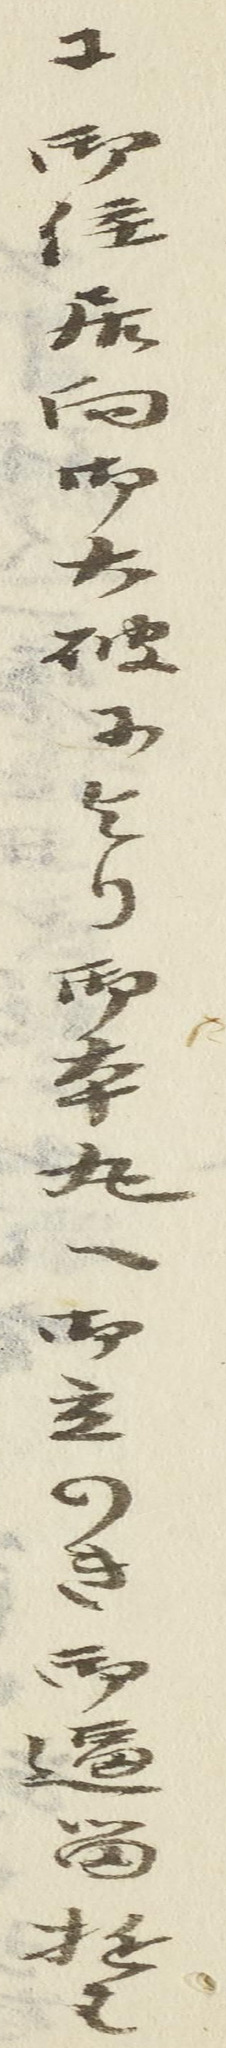に御住居向御大破により御本丸へ御立のき御逗留遊は
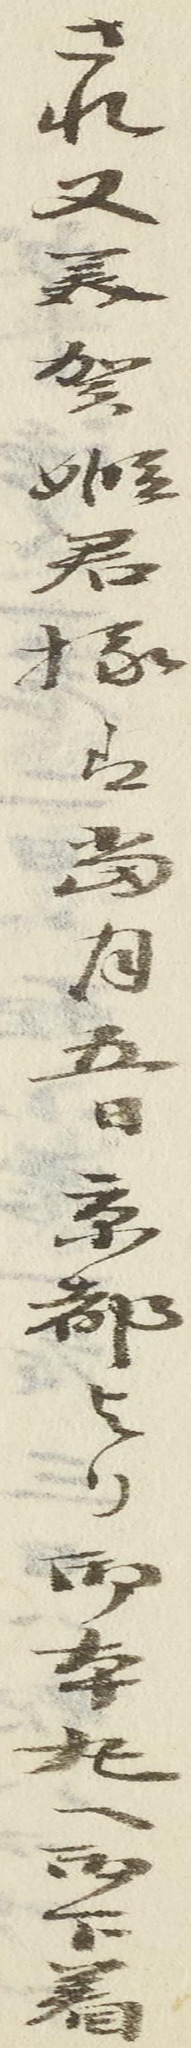され亦又美賀姫君様は当月五日京都より御本丸へ御下着
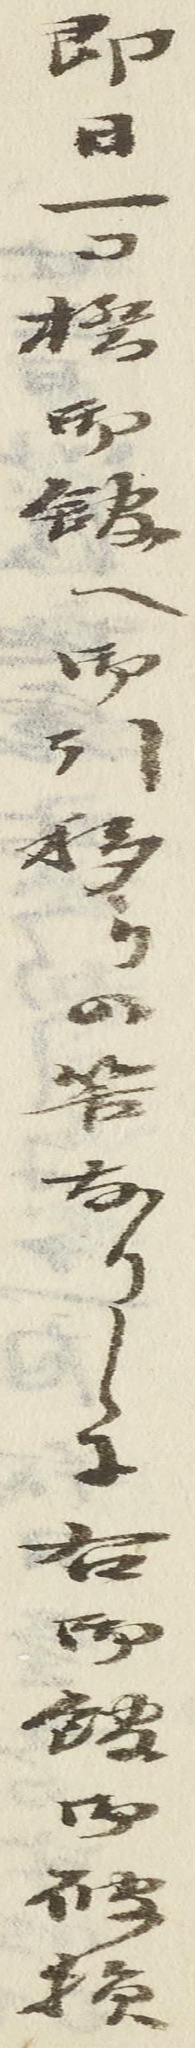即日一ッ橋御館へ御引移りの筈なりしに右御館御破損
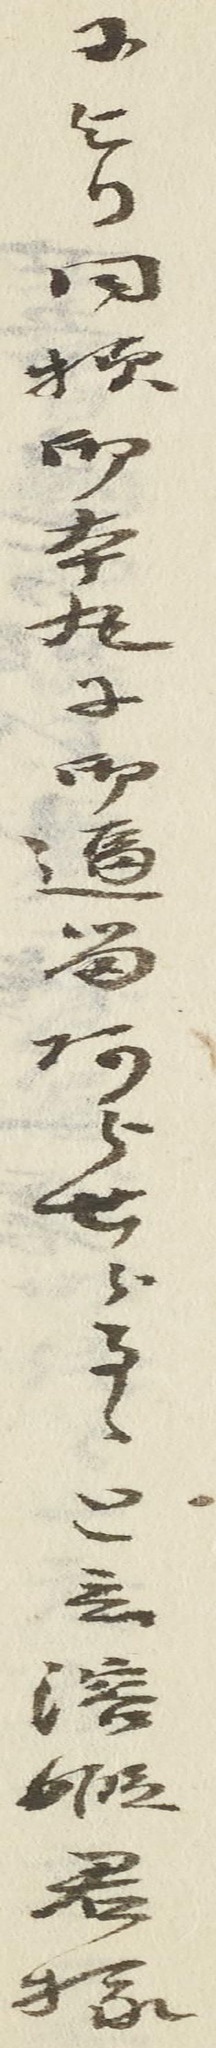により同夜御本丸に御逗留ならせらるゝろ云溶姫君様
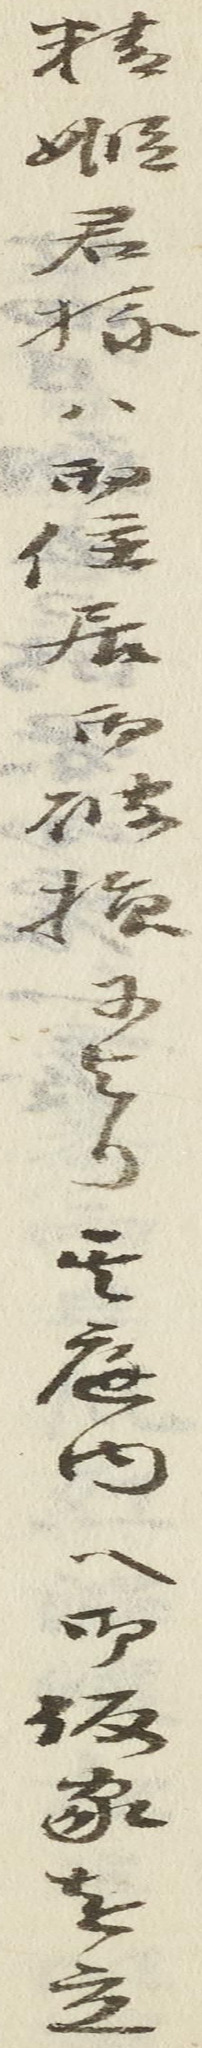精姫君様ハ御住居御破損により其庭内へ御仮家を立
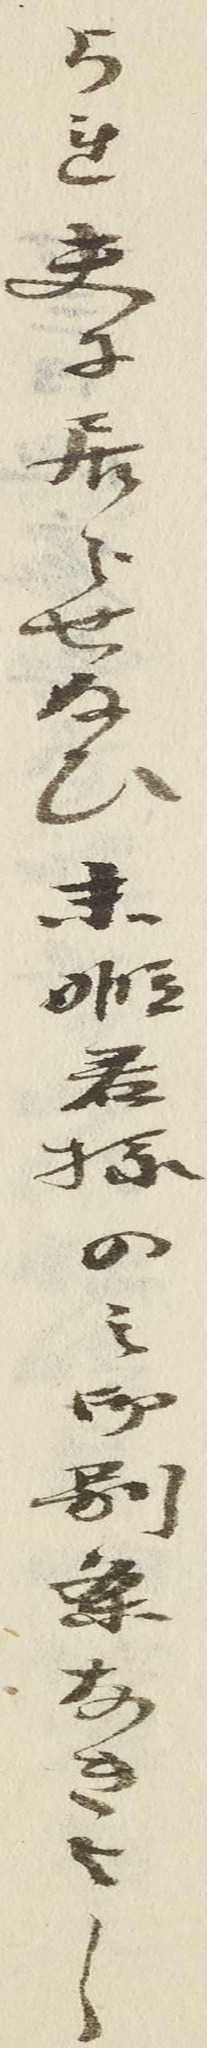られ夫に居らせなひ未姫君様のミ御別条なきよし
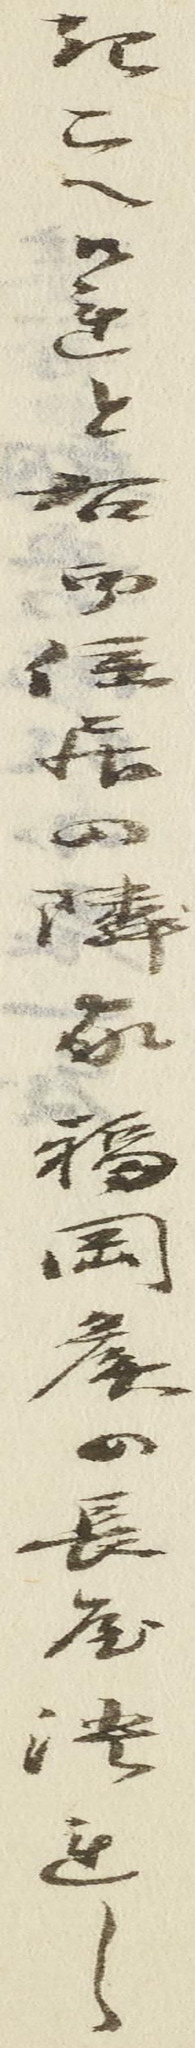きこへけれと右御住居の隣家福岡矦の長屋潰れし
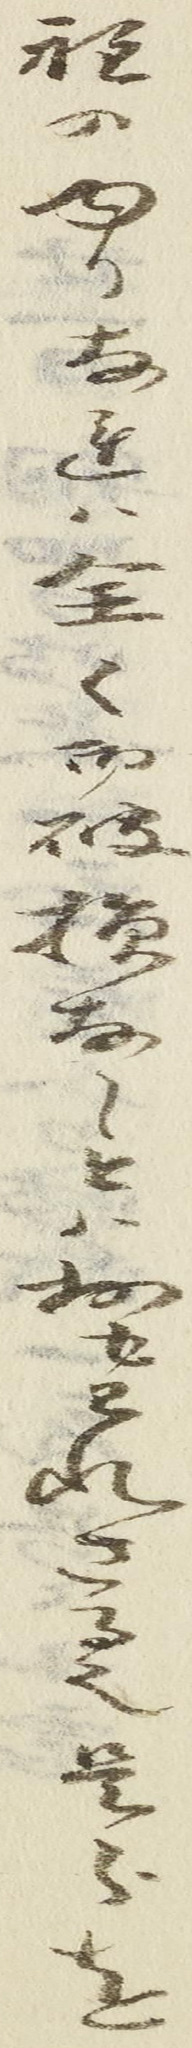程のゆりなれハ全く御破損なしとハおせわれさる也是らを
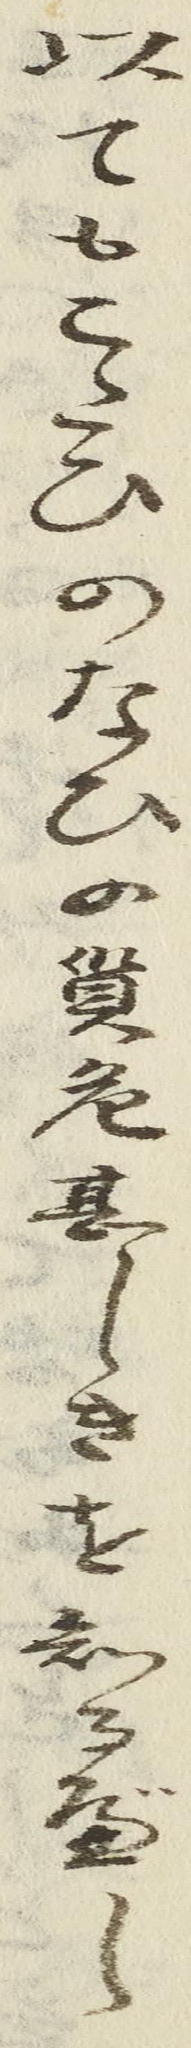以てもこたひのなひの災厄甚しきをしるべし
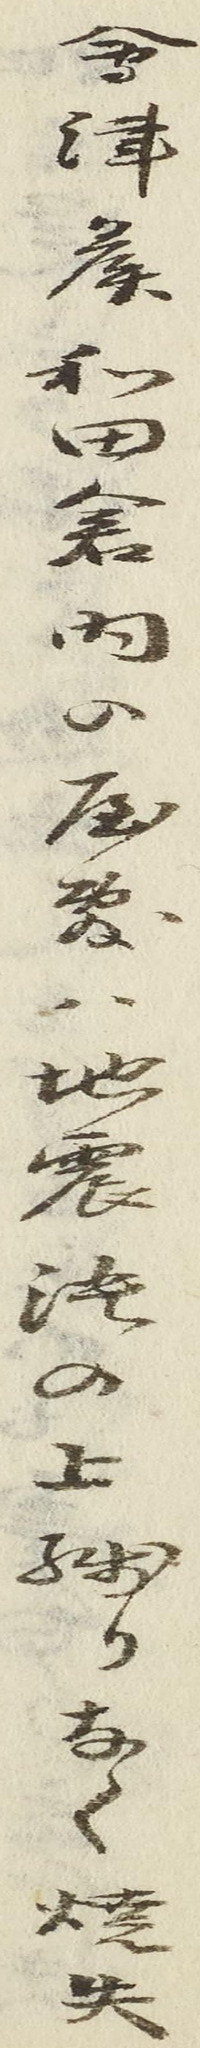会津矦和田倉内の屋敷ハ地震潰の上残りなく焼失
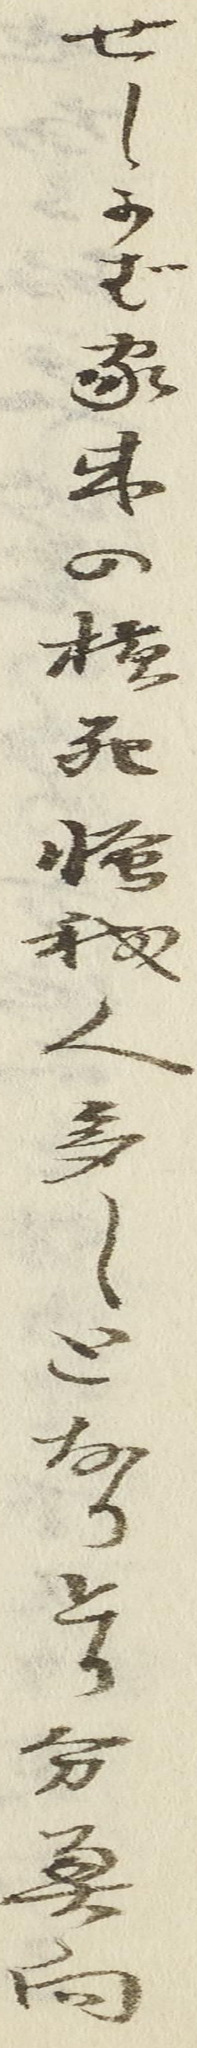せしかば家来の王氏怪我人多しとなりとり分奥向
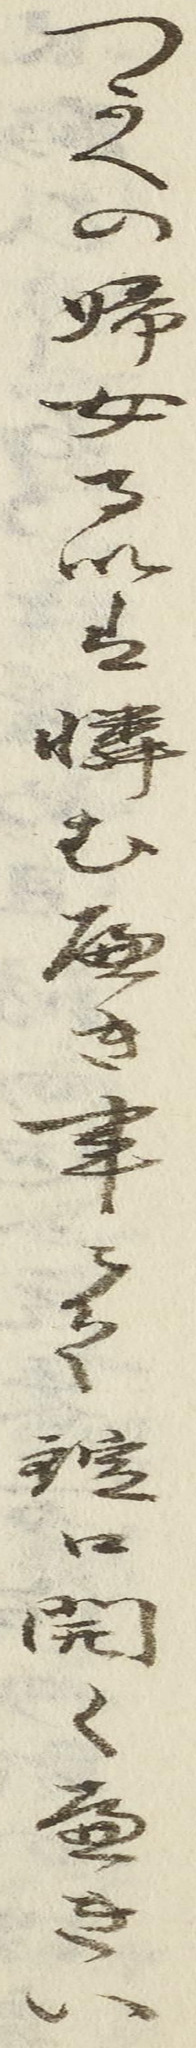つかへの婦女るいは憐むへき事二て錠口開くへきい
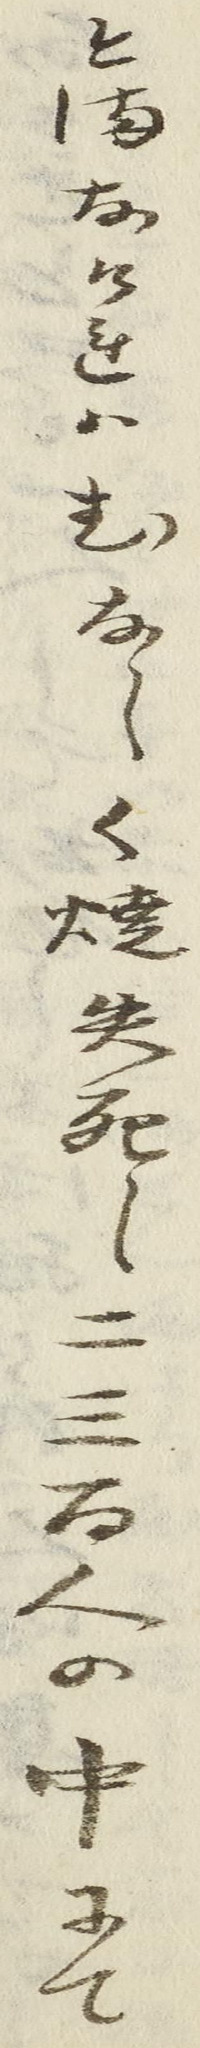とまなけれハむなしく焼失死し二三百人の中にて
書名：那為の後見艸　全
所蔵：東京大学地震研究所図書室 Earthquake Research Institute Library, The University of Tokyo, JAPAN
